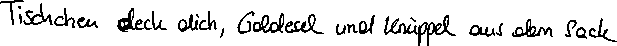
Tischlein deck dich, Goldesel und Knüppel aus dem Sack
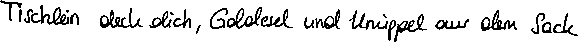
Tischlein deck dich, Goldesel und Knüppel aus dem Sack
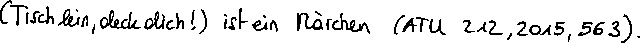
(Tischlein, deck dich!) ist ein Märchen (ATU 212, 2015, 563).
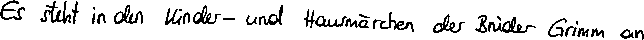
Es steht in den Kinder- und Hausmärchen der Brüder Grimm an
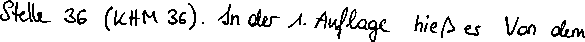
Stelle 36 (KHM 36). In der 1. Auflage hieß es Von dem
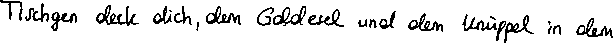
Tischgen deck dich, dem Goldesel und dem Knüppel in dem
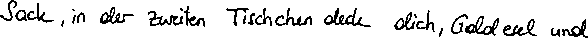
Sack, in der zweiten Tischchen deck dich, Goldesel und
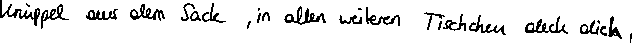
Knüppel aus dem Sack, in allen weiteren Tischchen deck dich,
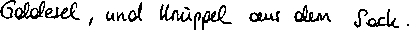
Goldesel, und Knüppel aus dem Sack.
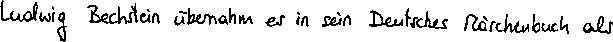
Ludwig Bechstein übernahm es in sein Deutsches Märchenbuch als
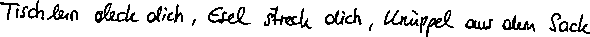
Tischlein deck dich, Esel streck dich, Knüppel aus dem Sack
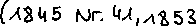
(1845 Nr. 41, 1853
